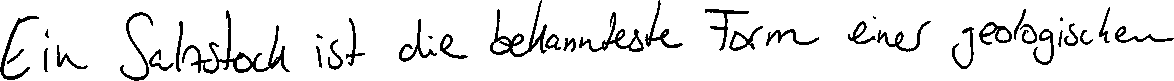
Ein Salzstock ist die bekannteste Form einer geologischen
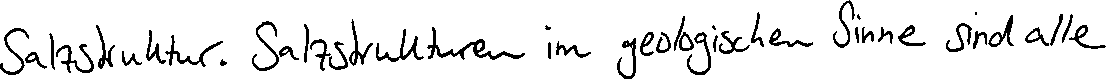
Salzstrukturen im geologischen Sinne sind alle
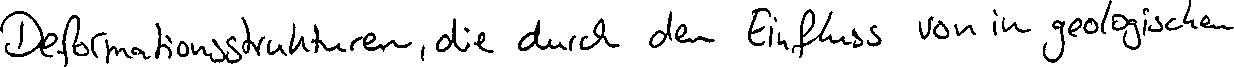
Deformationstrukturen, die durch den Einfluss von in geologischen
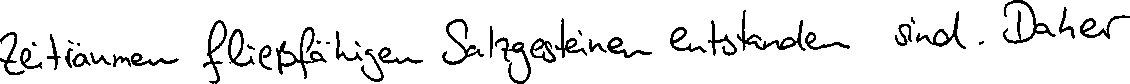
Zeiträumen fließfähigen Salzgesteinen entstanden sind. Daher
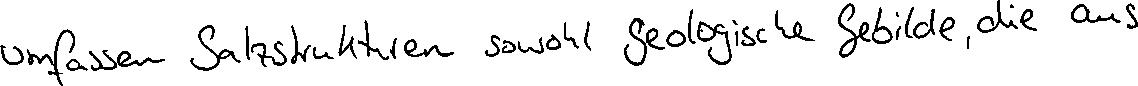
umfassen Salzstrukturen sowohl geologische Gebilde, die aus
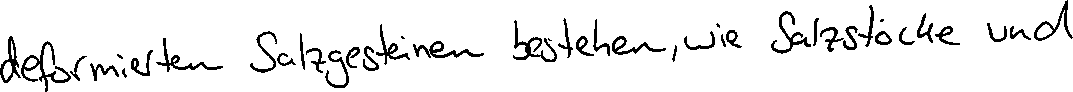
deformierten Salzgesteinen bestehen, wie Salzstöcke und
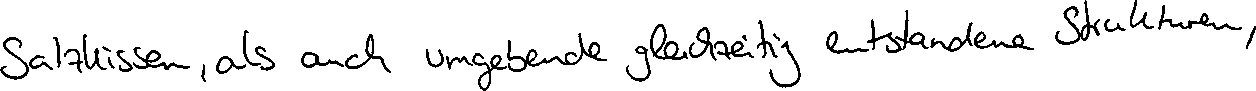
Salzkissen, als auch umgebende gleichzeitig entstandene Strukturen,
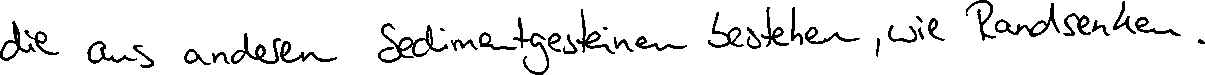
die aus anderen Sedimentgesteinen bestehen, wie Randsenken.
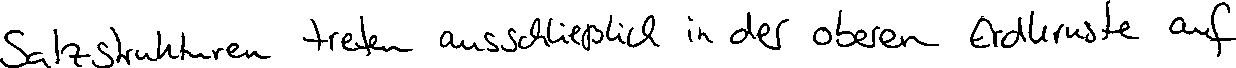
Salzstrukturen treten ausschließlich in der oberen Erdkruste auf
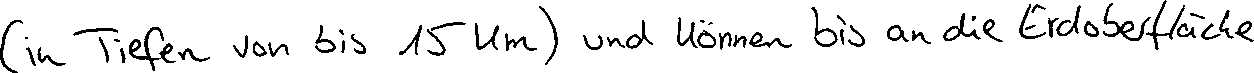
(in Tiefen von bis 15 km) und können bis an die Erdoberfläche
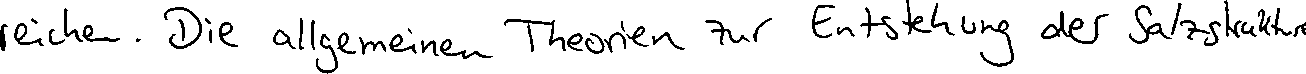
reichen. Die allgemeinen Theorien zur Entstehung der Salzstrukturen
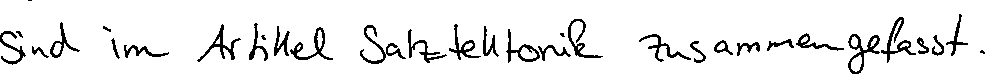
sind im Artikel Salztektonik zusammengefasst.
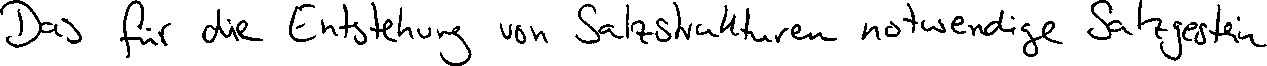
Das für die Entstehung von Salzstrukturen notwendige Salzgestein
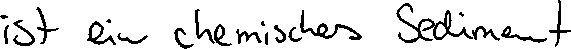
ist ein chemisches Sediment
